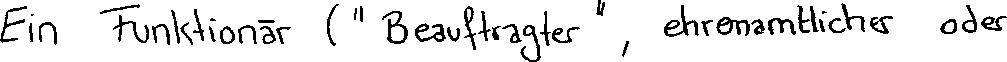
Ein Funktionär ("Beauftragter", ehrenamtlicher oder
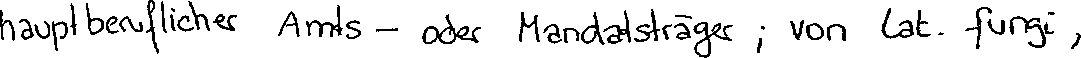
hauptberuflicher Amts- oder Mandatsträger; von lat. fungi,
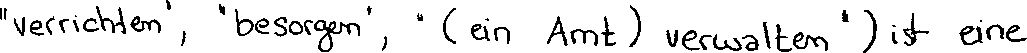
"verrichten", "besorgen", "(ein Amt) verwalten") ist eine
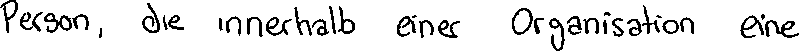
Person, die innerhalb einer Organisation eine
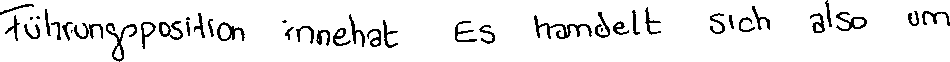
Führungsposition innehat. Es handelt sich also um
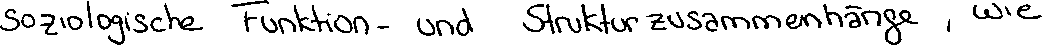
soziologische Funktions- und Strukturzusammenhänge, wie
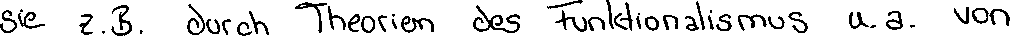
sie z. B. durch Theorien des Funktionalismus u. a. von
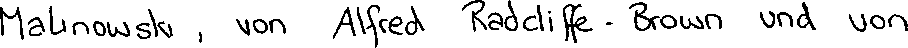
Malinowski, von Alfred Radcliffe-Brown und von
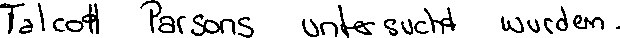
Talcott Parsons untersucht wurden.
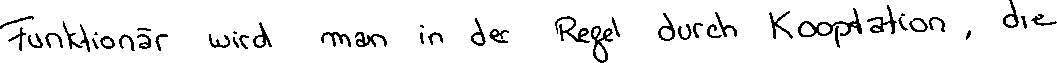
Funktionär wird man in der Regel durch Kooptation, die
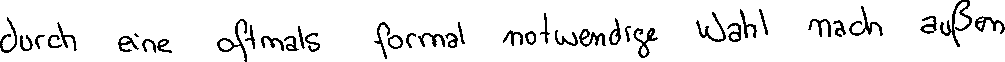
durch eine oftmals formal notwendige Wahl nach außen
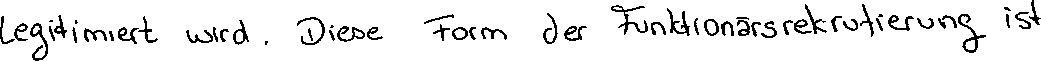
legitimiert wird. Diese Form der Funktionärsrekrutierung ist
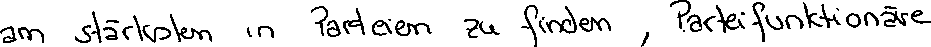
am stärksten in Parteien zu finden, Parteifunktionäre
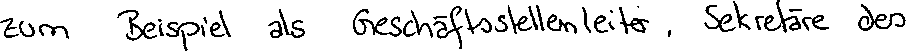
zum Beispiel als Geschäftsstellenleiter, Sekretäre des
